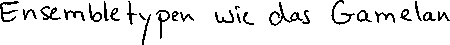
Ensembletypen wie das Gamelan
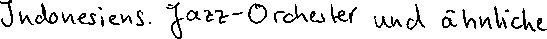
ndonesiens Jazz-Orchester und ähnliche
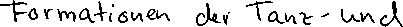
Formationen der Tanz- und
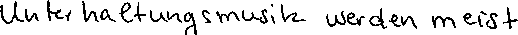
Unterhaltungsmusik werden meist
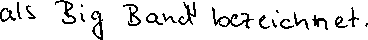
als Big Band bezeichnet.
